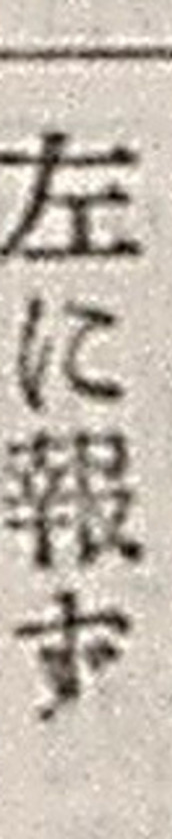左に報ず
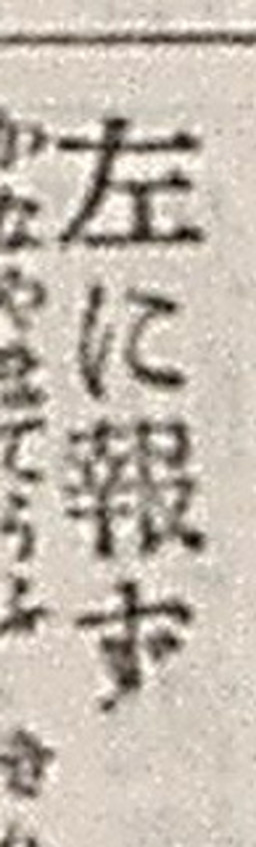左に報ず
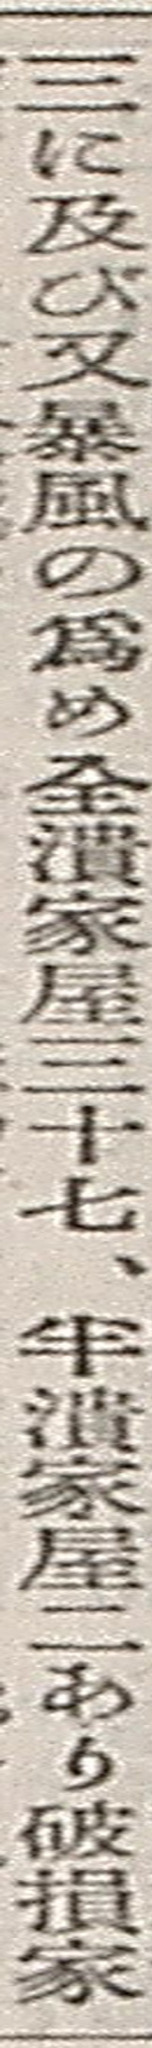三に及び又暴風の為め全潰家屋三十七、半潰家屋二あり破損家
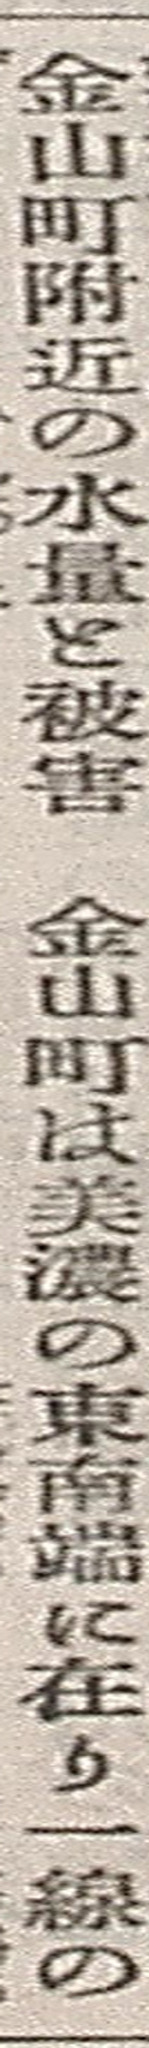金山町附近の水量と被害金山町は美濃の東南端に在り一線の
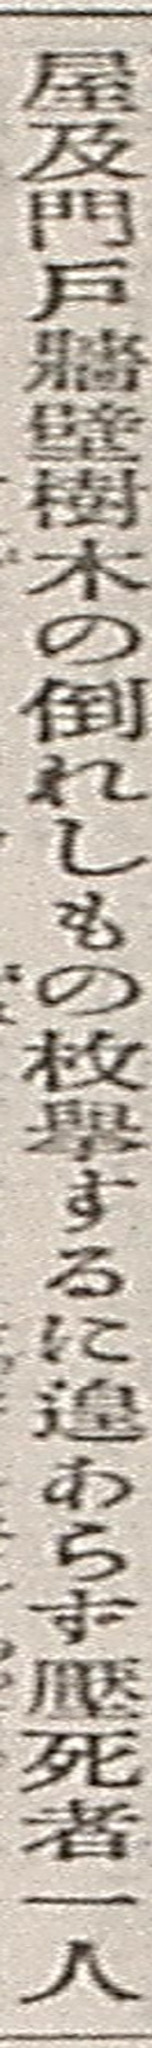屋及門戸牆壁樹木の倒れしもの枚挙するに遑あらず壓死者一人
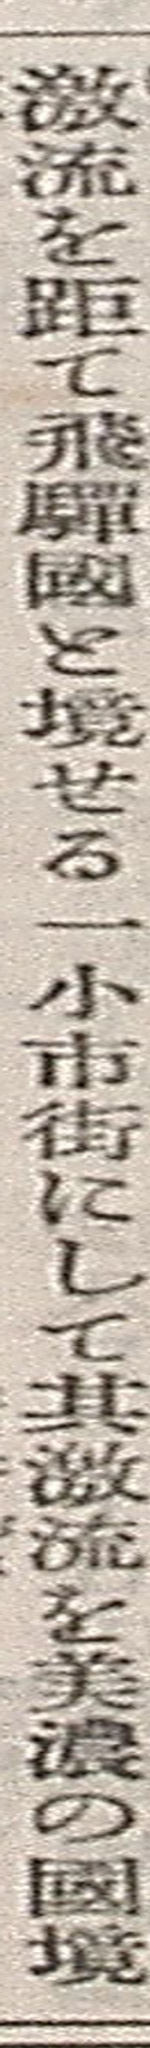激流を距て飛騨国と境せる一小市街にして其激流を美濃の国境
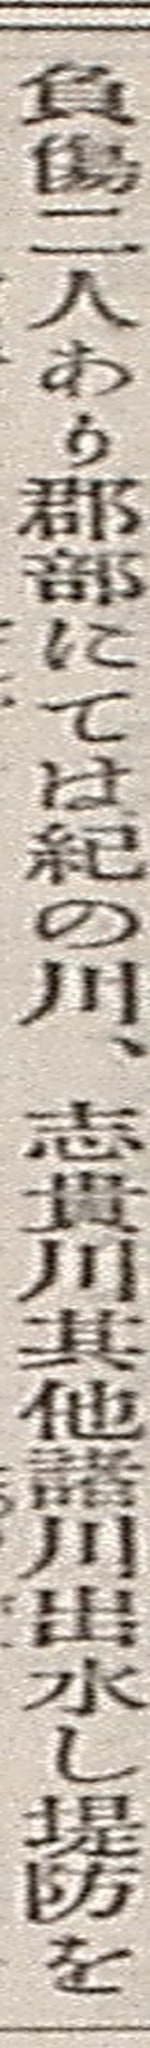負傷二人あり郡部にては紀の川、志貴川其他諸川出水し堤防を
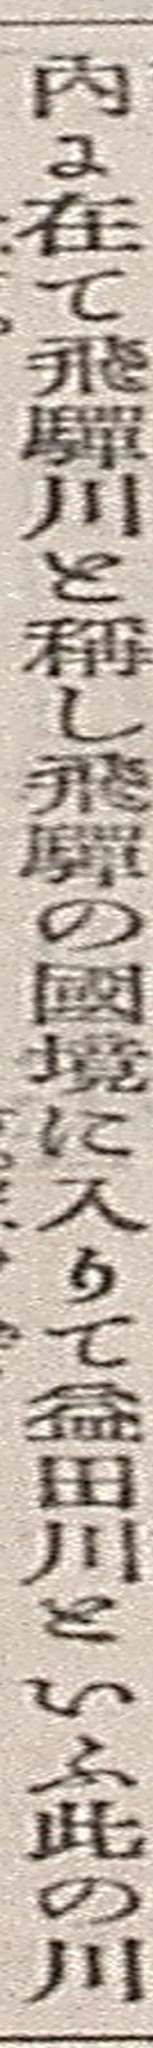内に在て飛騨川と称し飛騨の国境に入りて益田川といふ此の川
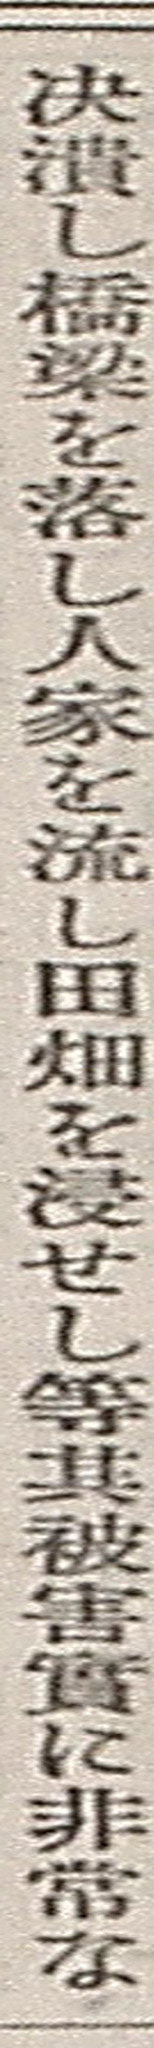决潰し橋梁を落し人家を流し田畑を浸せし等其被害実に非情な
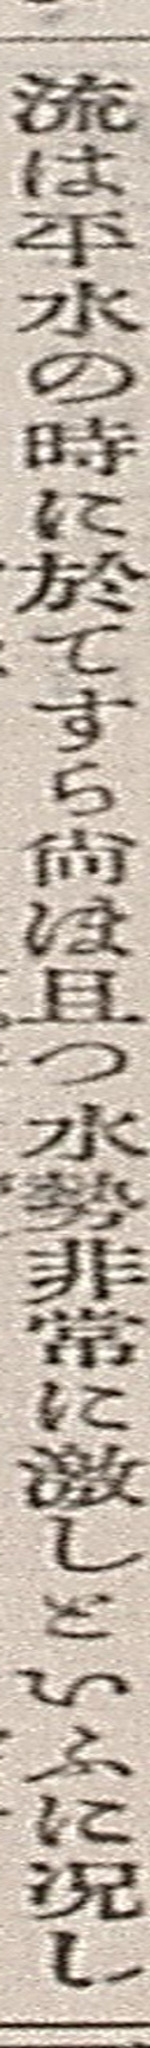流は平水の時に於てすら尚ほ且つ水勢非常に激しといふに況し
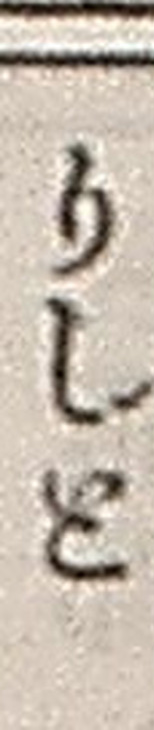りしと
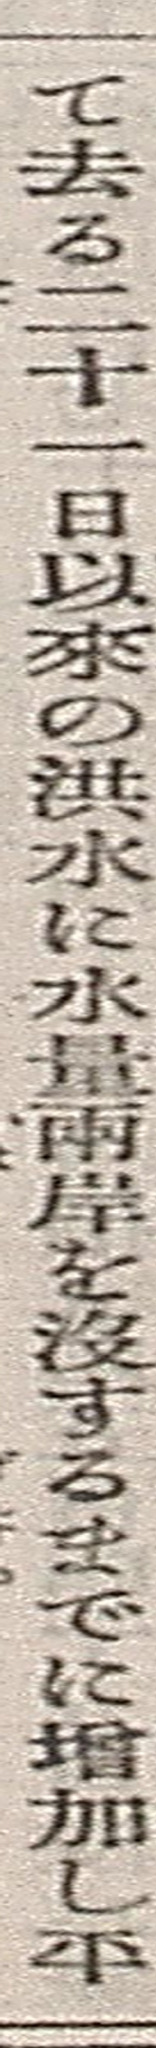て去る二十一日以来の洪水に水量両岸を没するまでに増加し平
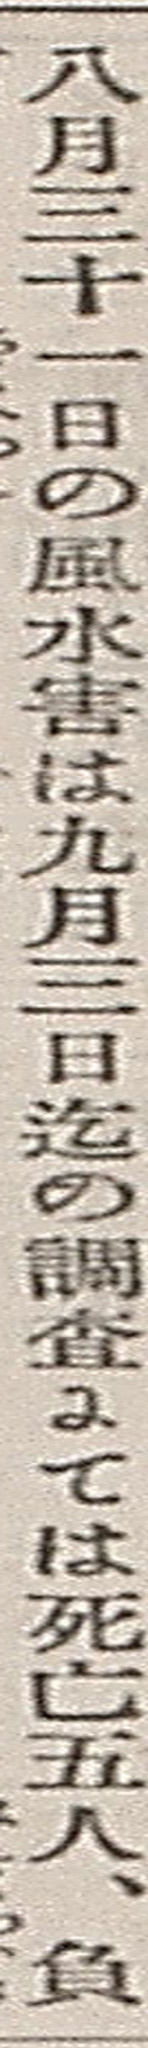八月三十一日の風水害は九月三日迄の調査にては死亡五人、負
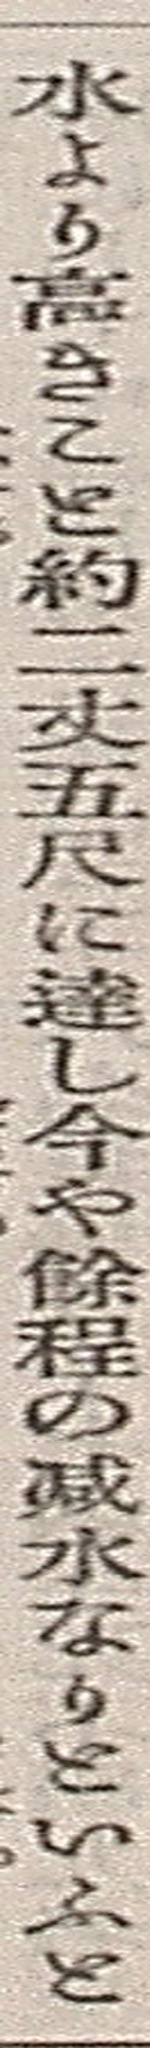水より高きこと約二丈五尺に達し今や餘程の減水なりといふと
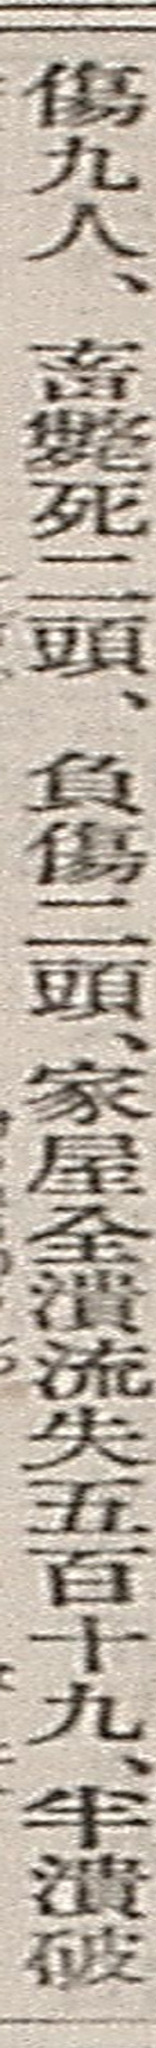傷九人、畜斃死二頭、負傷二頭、家屋全潰流失五百十九、半潰破
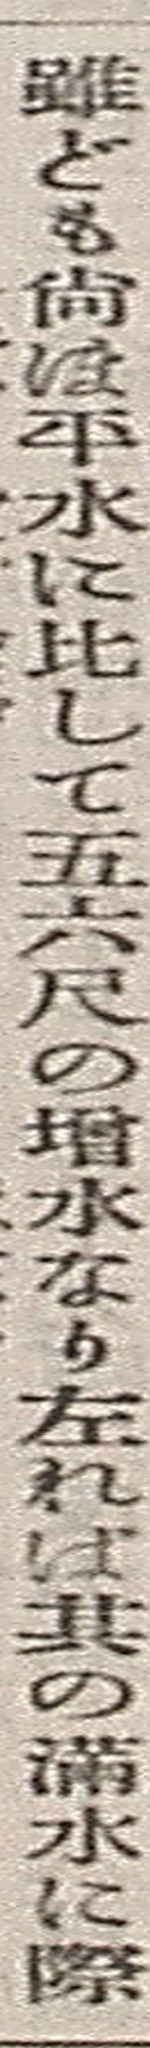雖ども尚ほ平水に比して五六尺の増水なり左れば其の満水に際
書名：風俗畫報臨時増刊第百二十八號　洪水被害録（下）
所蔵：東京大学地震研究所図書室 Earthquake Research Institute Library, The University of Tokyo, JAPAN
